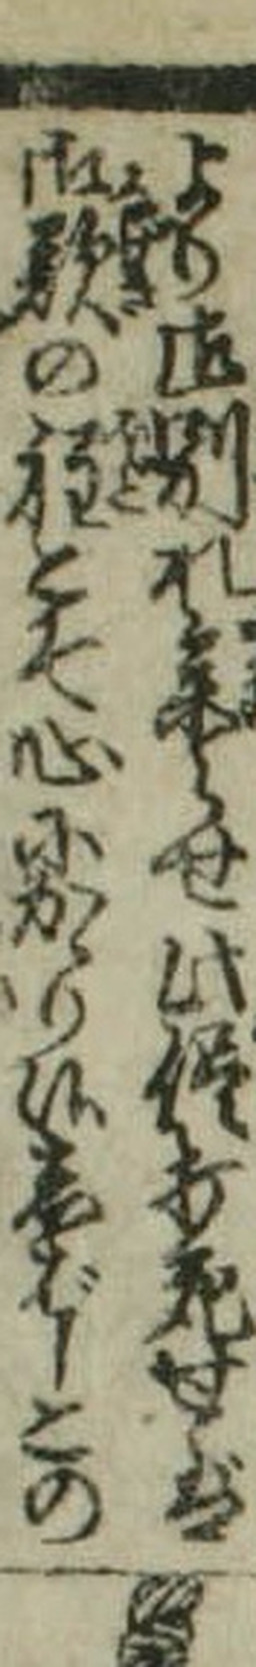御歎の程こそ心にかゝり候しばしこの
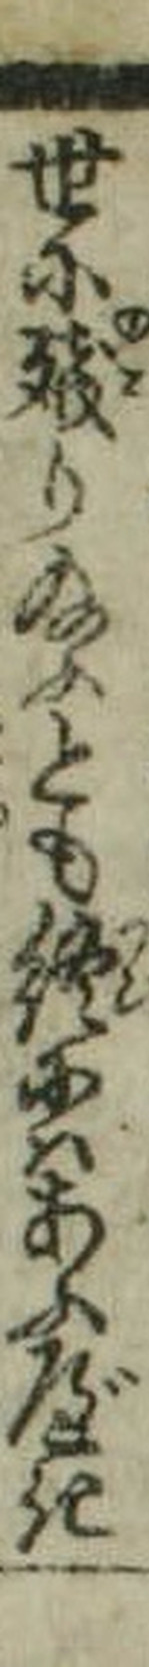世に残り給ふとも終にはあふべき
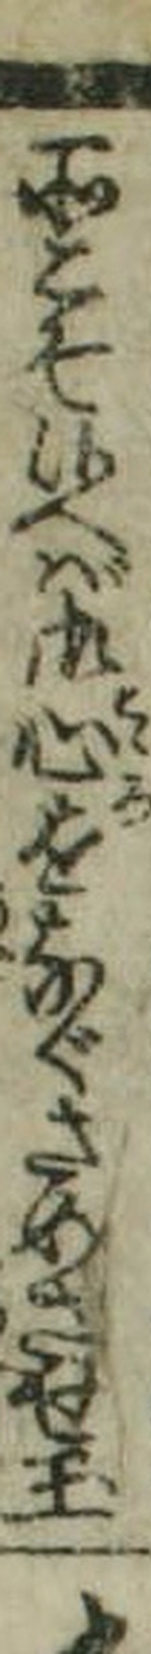所こそ候へば御心をなぐさめさせ玉
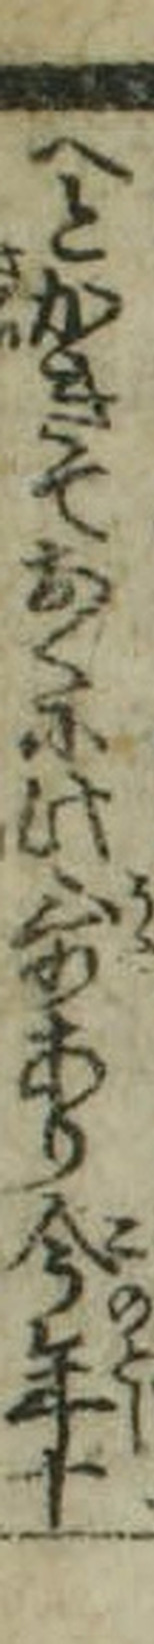へとかきておくに此歌あり今年十
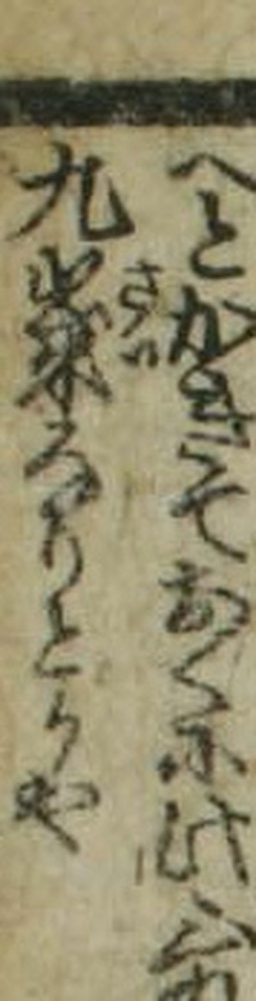九歳なりとかや
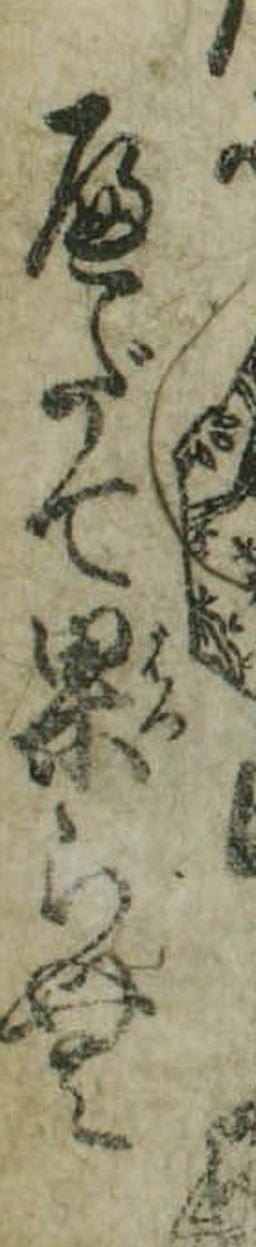へだて果らむ

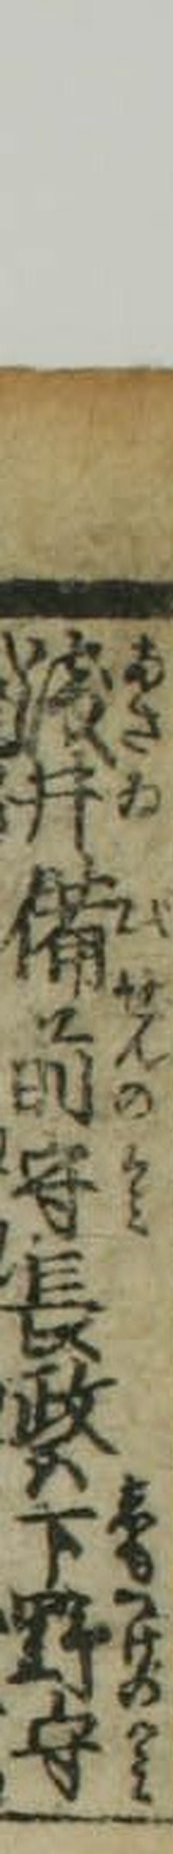浅井備前守長政は下野守
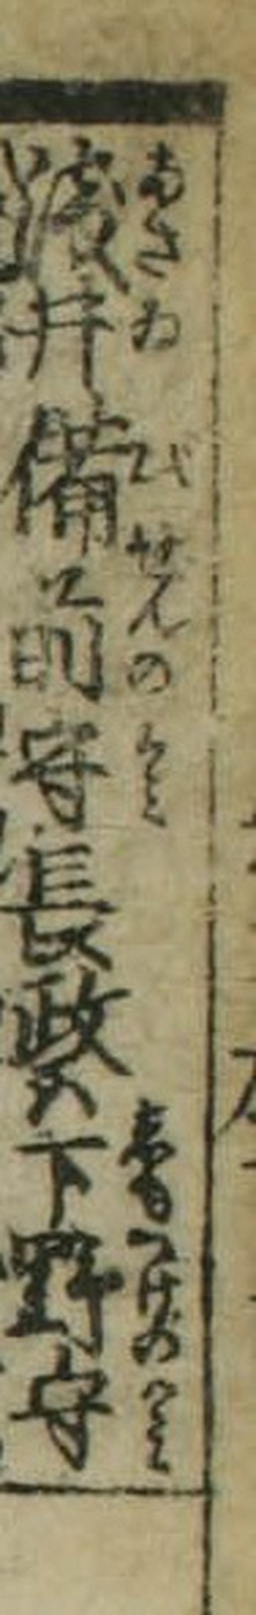浅井備前守長政は下野守
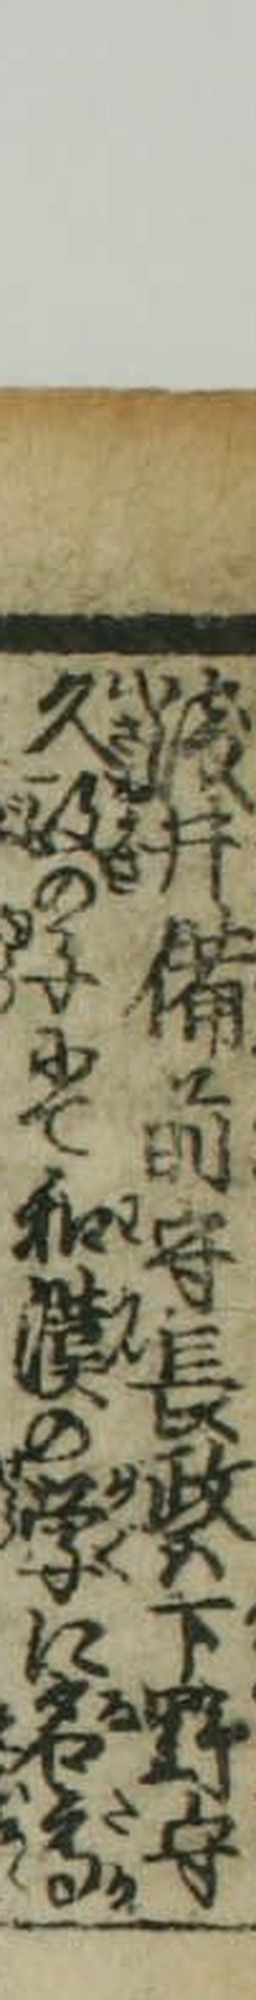久政の子にて和漢の学に名高
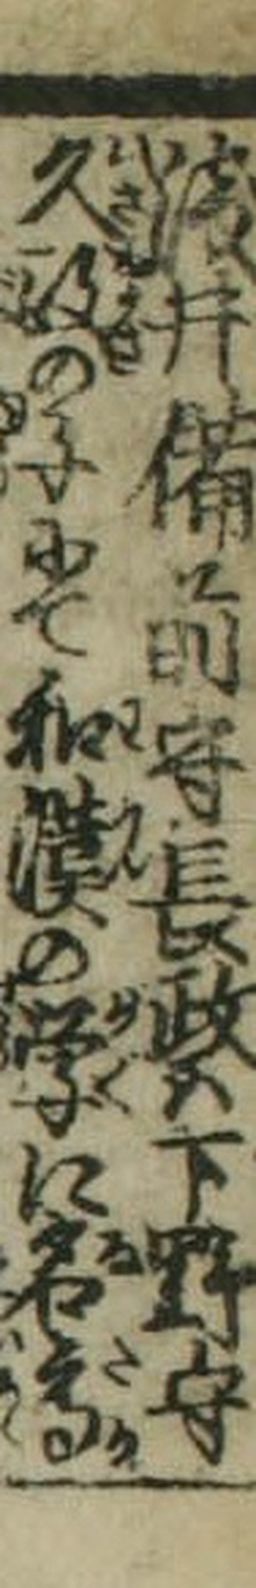久政の子にて和漢の学に名高
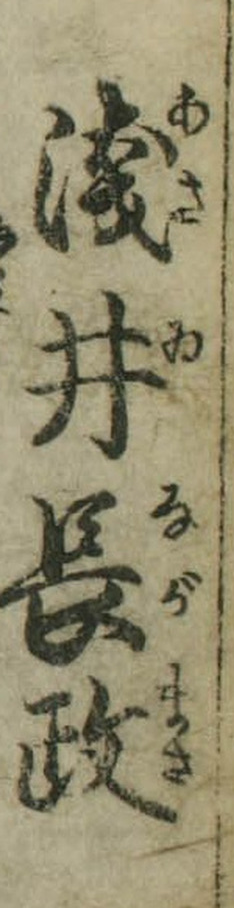浅井長政
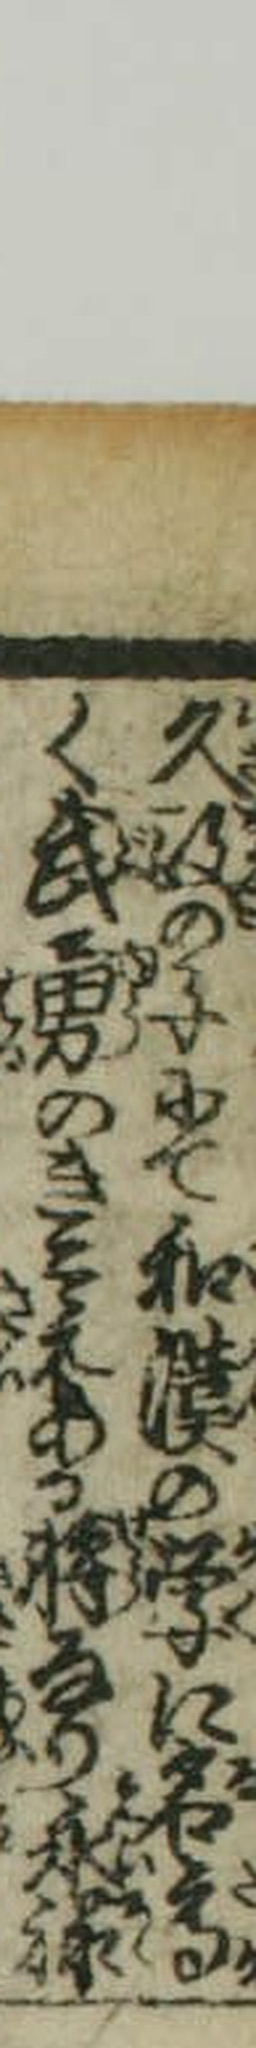く武勇のきこえある将なり永禄
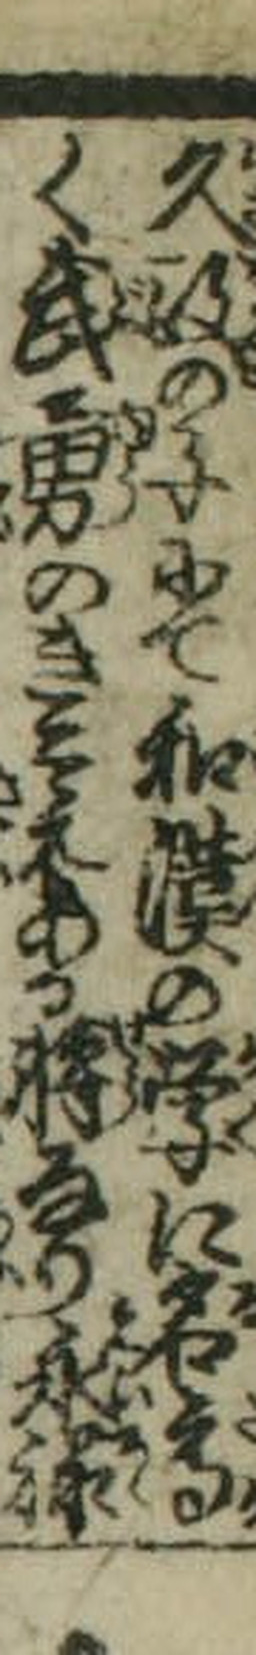く武勇のきこえある将なり永禄
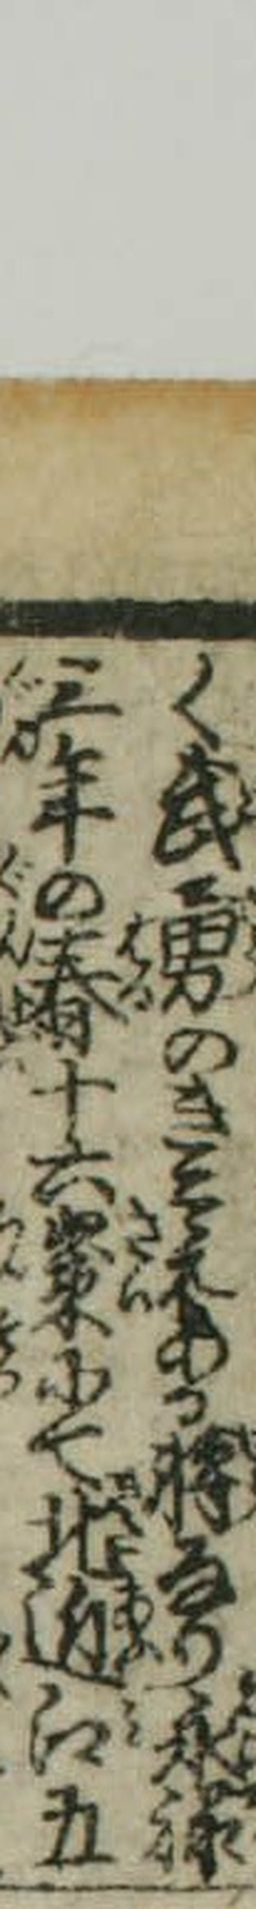三年の春十六歳にて北近江五
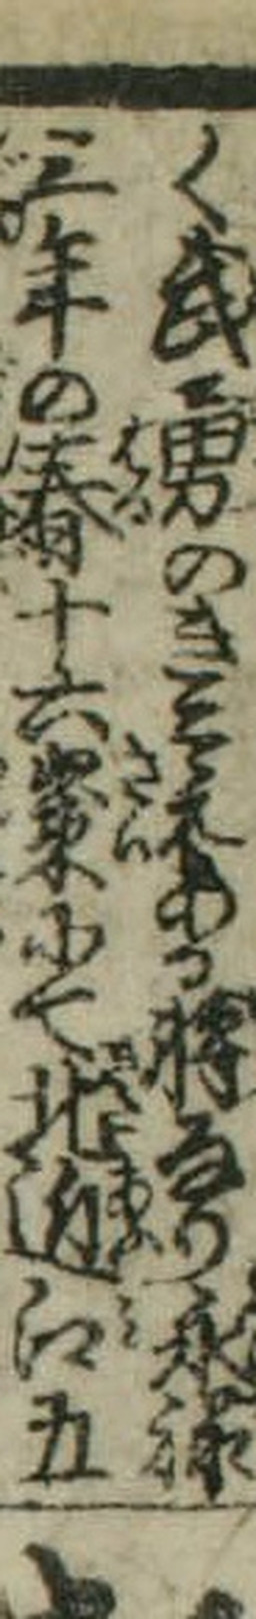三年の春十六歳にて北近江五
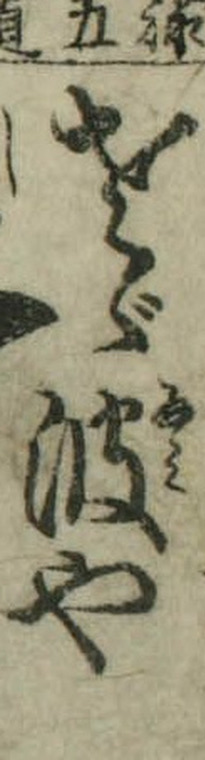さゞ波や
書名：續英雄百人一首
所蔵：東京学芸大学附属図書館
